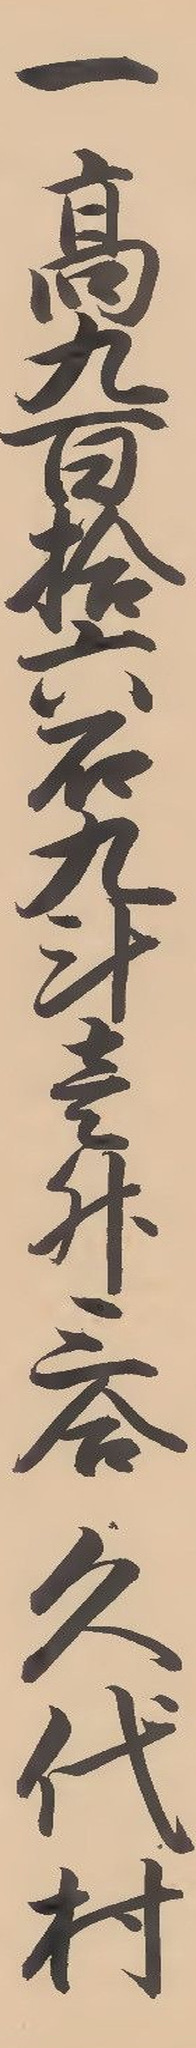一高九百拾六石九斗壱升三合久代村
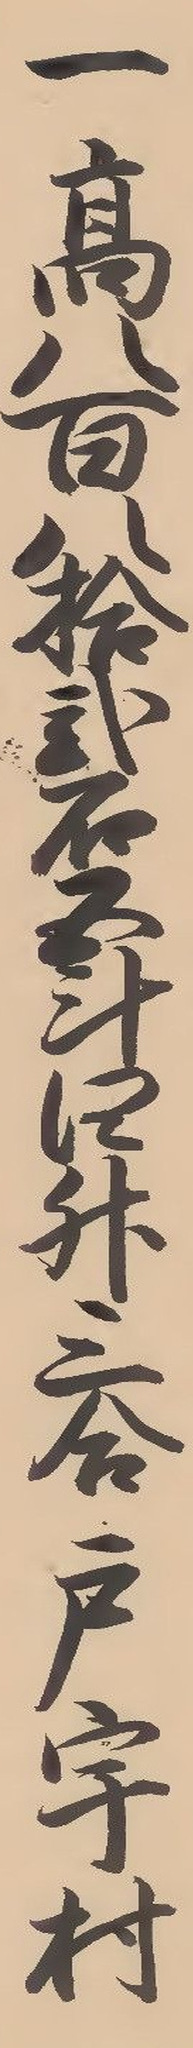一高八百八拾弐石五斗四升三合戸宇村
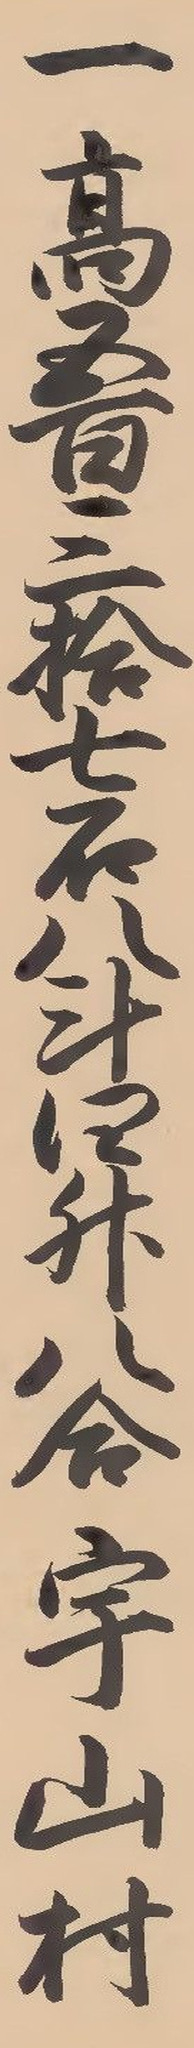一高五百三拾七石八斗四升八合宇山村
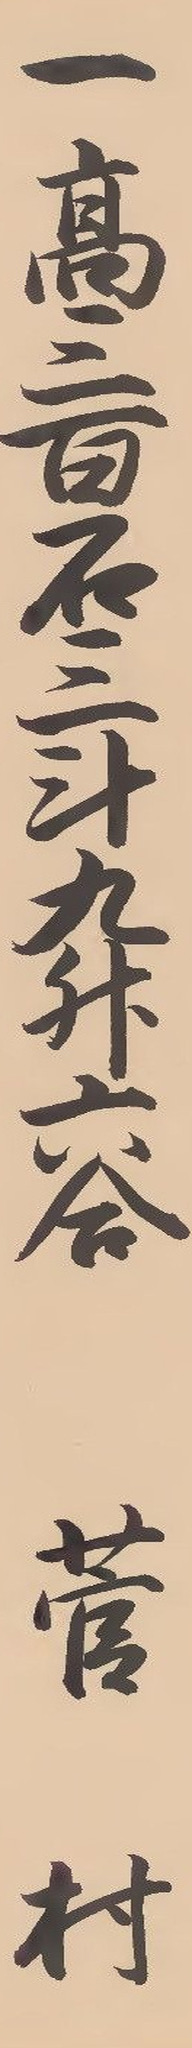一高三百石三斗九升六合菅村
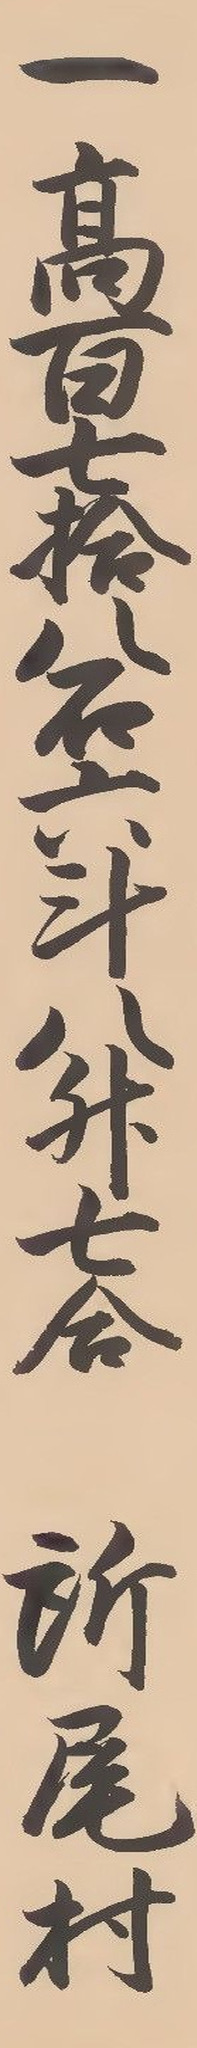一高百七拾八石六斗八升七合所尾村
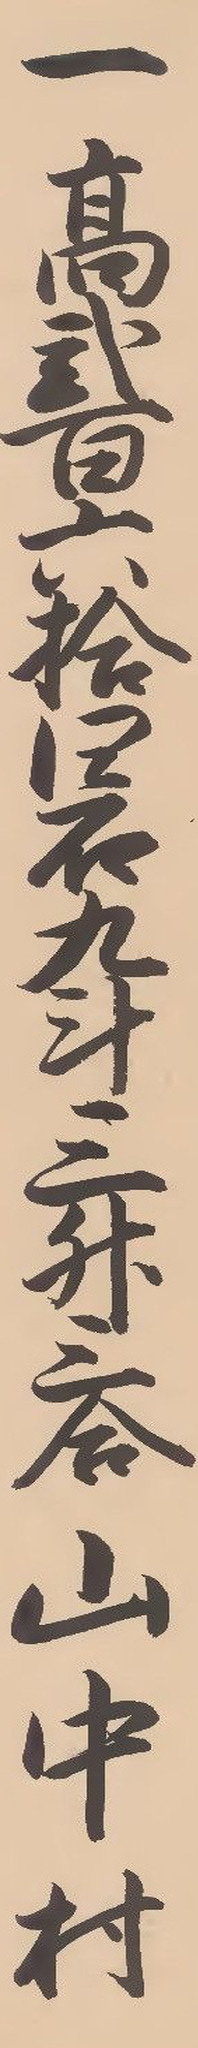一高弐百六拾四石九斗三升三合山中村
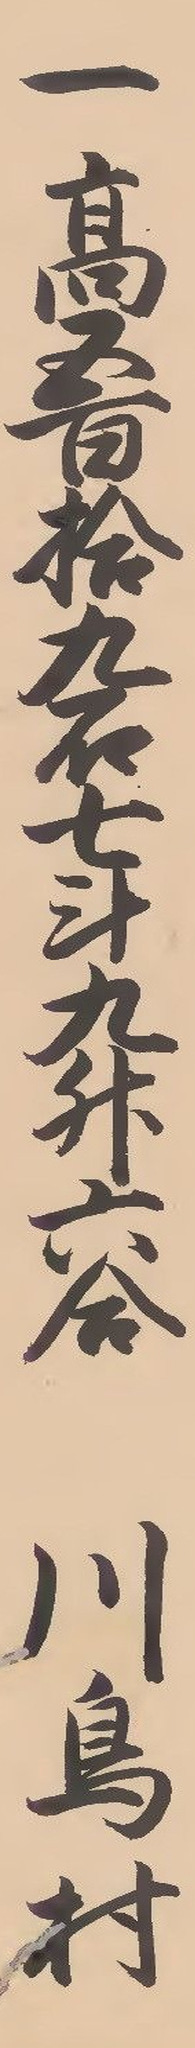一高五百拾九石七斗九升六合川鳥村

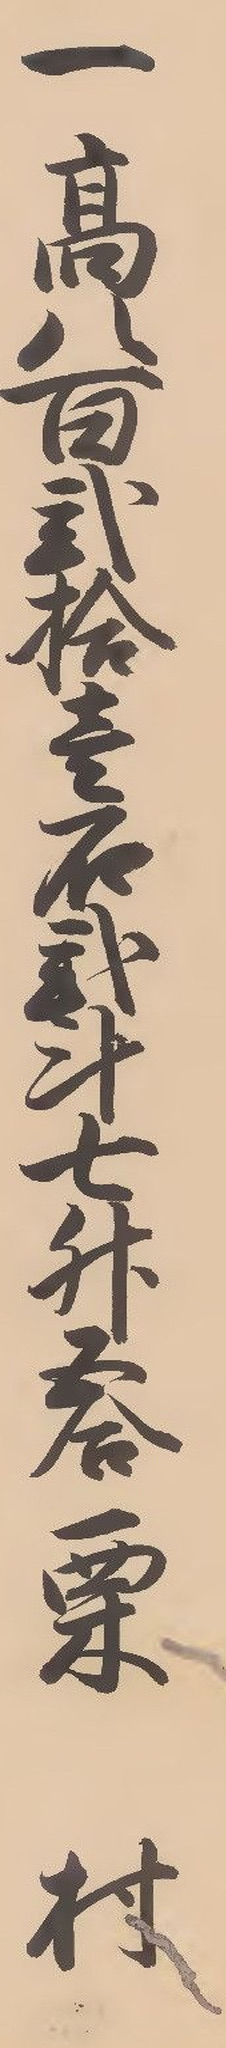一高八百弐拾壱石弐斗七升五合栗村
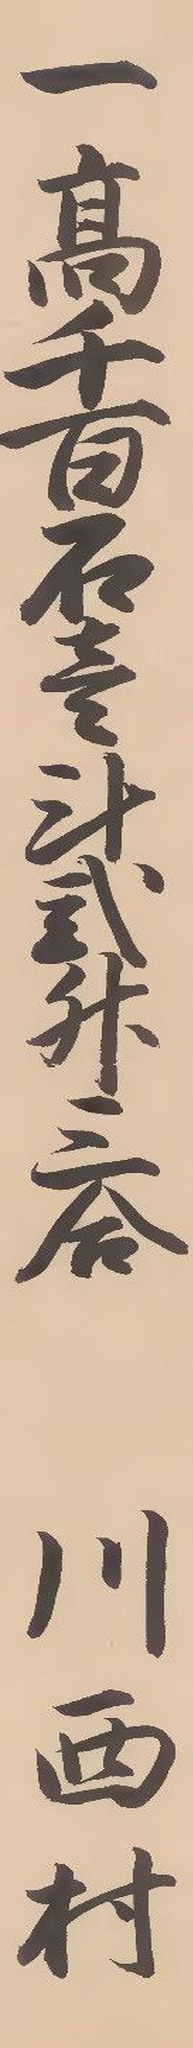一高千百石壱斗弐升三合川西村
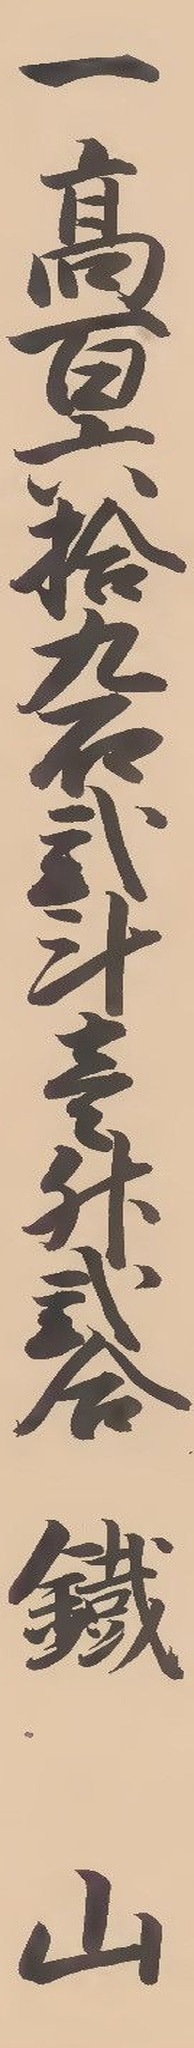一高百六拾九石弐斗壱升弐合鉄山
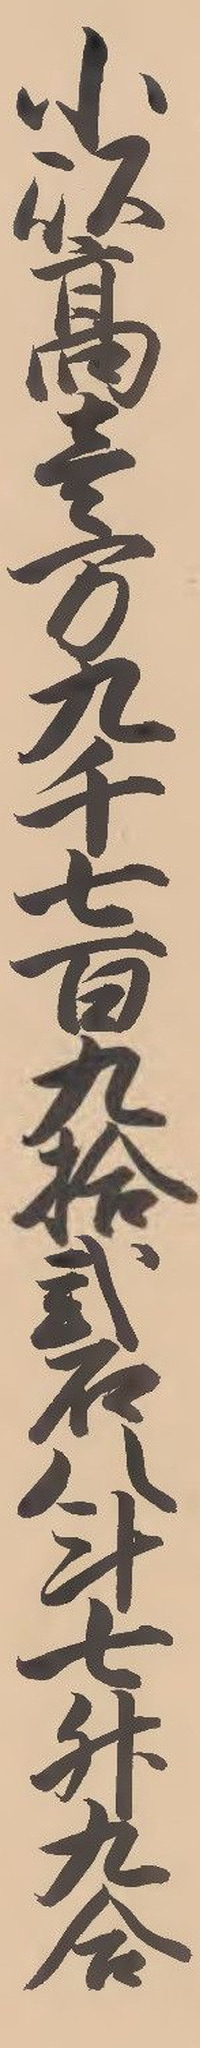小以高壱万九千七百九拾弐石八斗七升九合

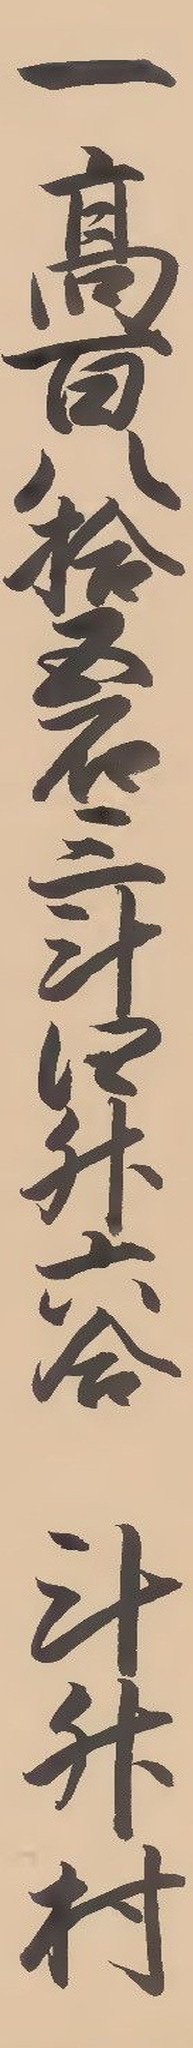一高百八拾五石三斗四升六合斗升村
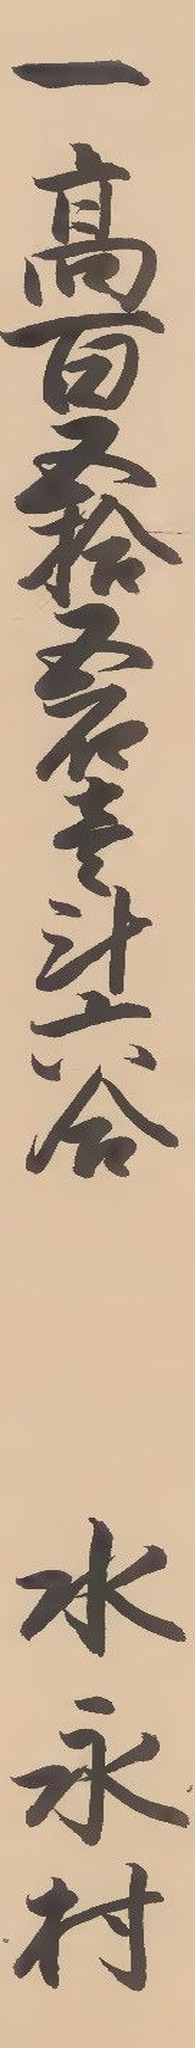一高百五拾五石壱斗六合水永村
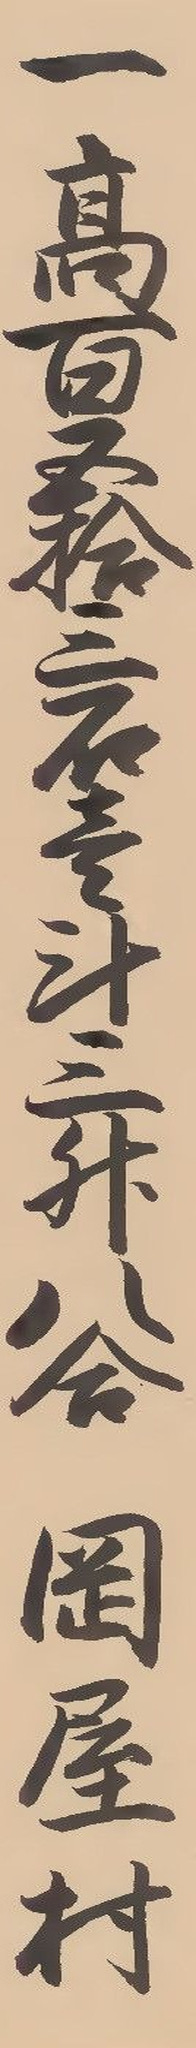一高百五拾三石壱斗三升八合岡屋村
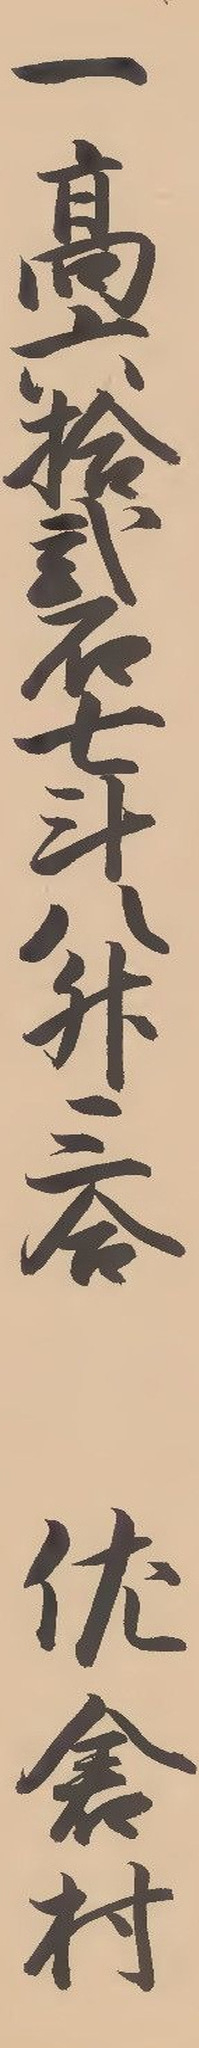一高六拾弐石七斗八升三合佐倉村
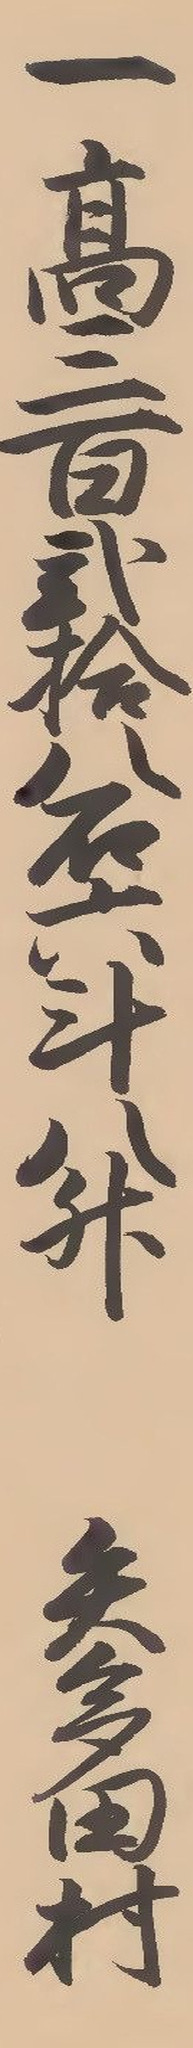一高三百弐拾八石六斗八升矢多田村
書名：備後国郷帳
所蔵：国立公文書館 National Archives of Japan
